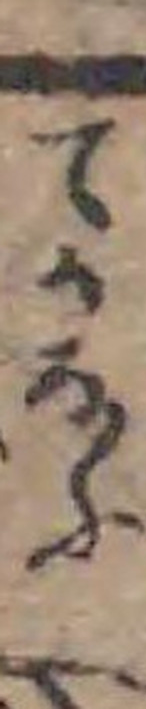てかなふ
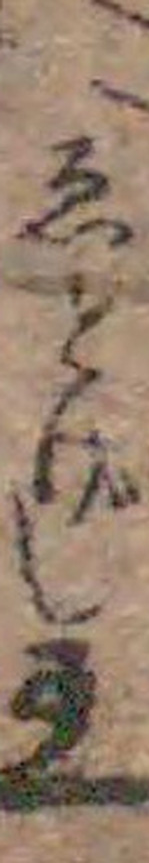ゑとげし事
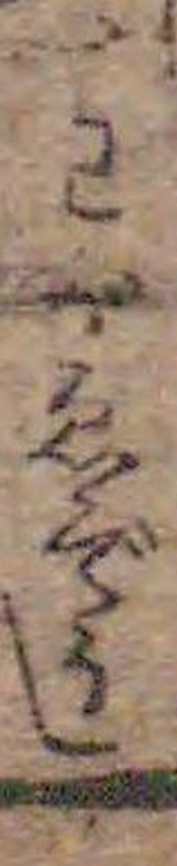わがゑぞうし
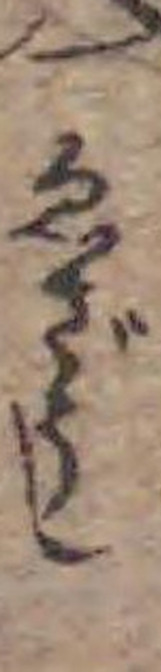ゑざうし
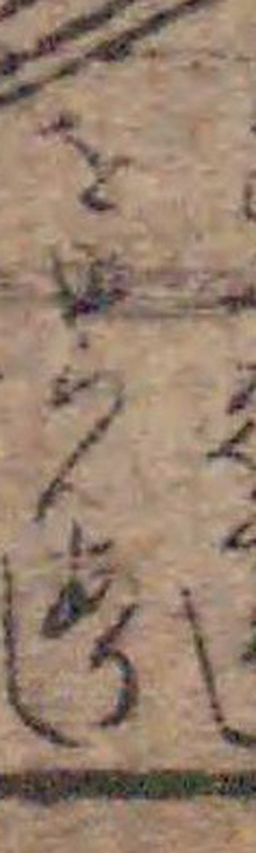を御らんありし
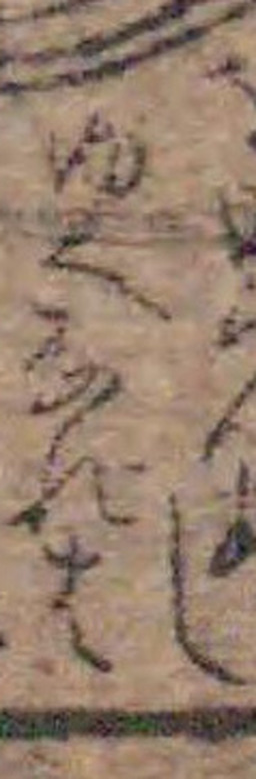ゆへなれは
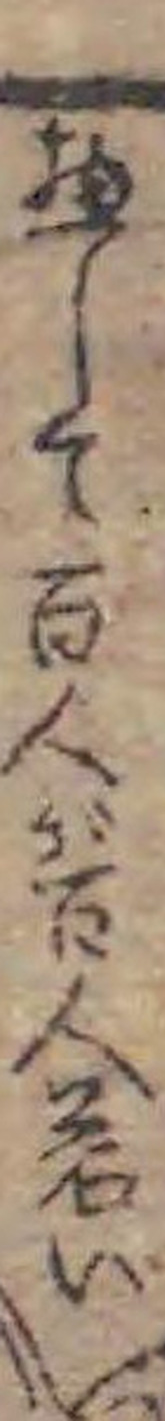惣して百人が百人若い
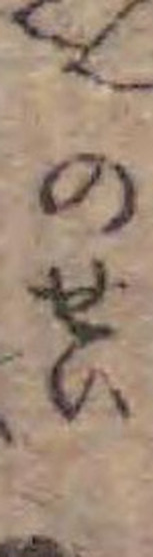のせい
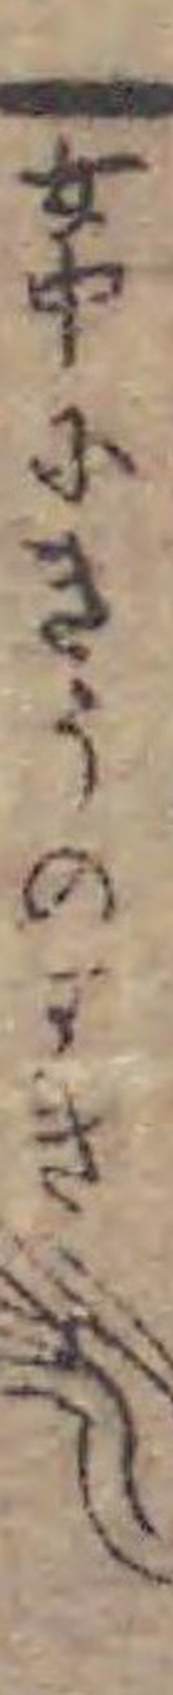女中にきうのすき
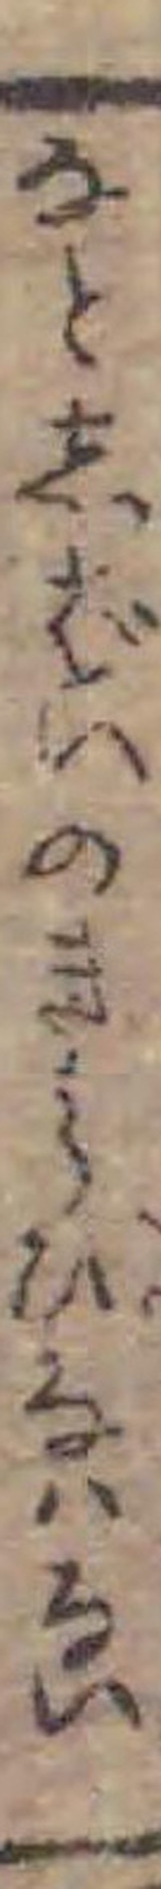なとしばいのきらひなはない
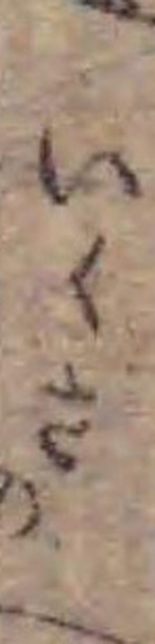いくさの
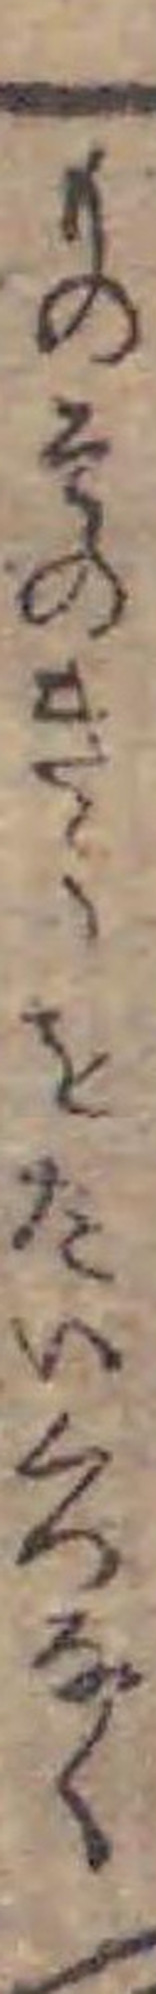ものそのきうをたいくつなく
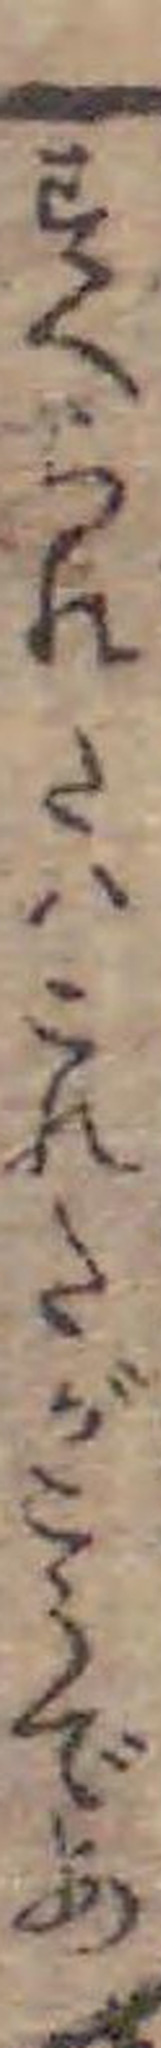すへられたはこれたがこうであ
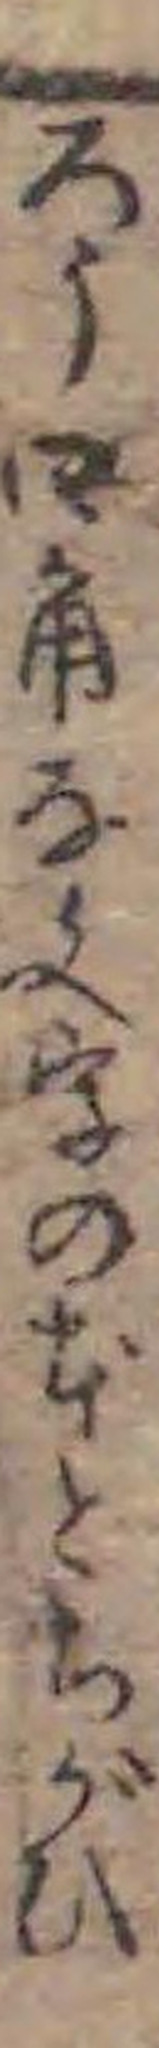ろう四角な文字の本とちがひ
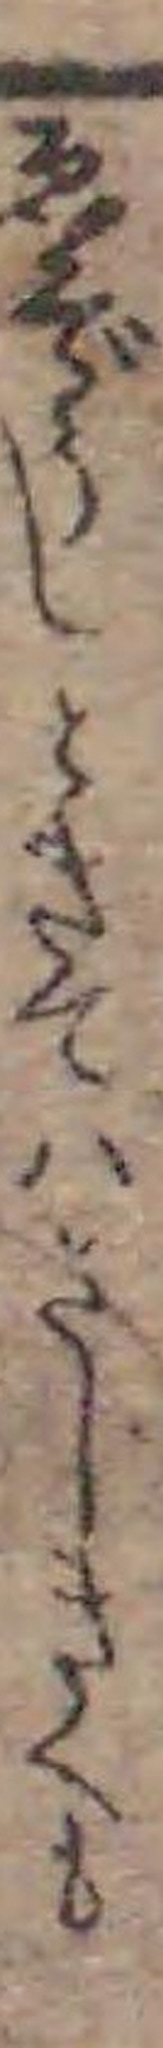ゑぞうしときてはさしきへも
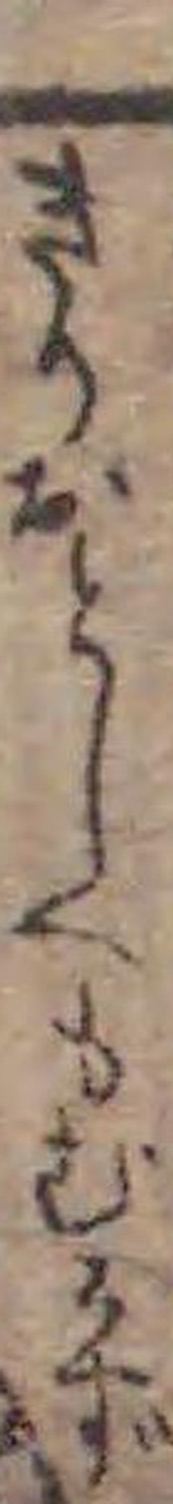きりおとしへもむかず
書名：三舛増鱗組 : 3巻
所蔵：国立国会図書館 National Diet Library, JAPAN
